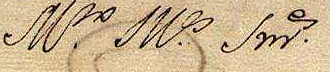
M.to Ill.es Snr.es
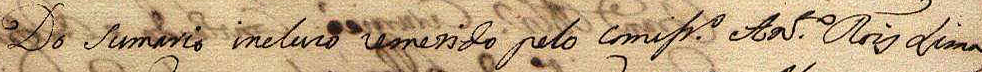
Do sumario incluzo remetido pelo comisr.o An.to Rois̄ Lima,
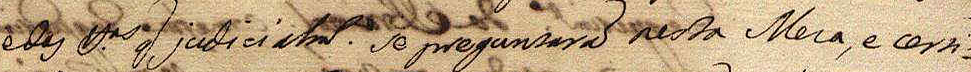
e das tt.as q̄ judicialm.te se perguntaraõ nesta Meza, e certi
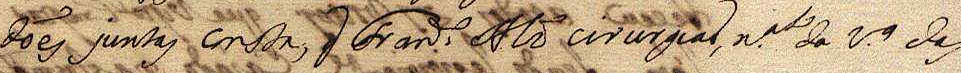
dões juntas consta, q̄ Fran.co Alz̄ cirurgiaõ, n.al da V.a das
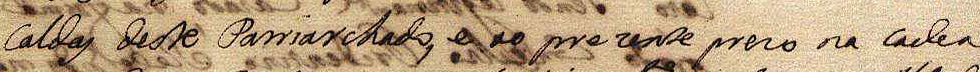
Caldas deste Patriarchado, e ao prezente prezo na cadea
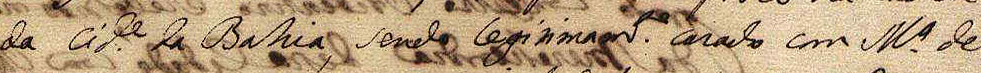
da Cid.e da Bahia, sendo legitimam.te cazado com M.a de
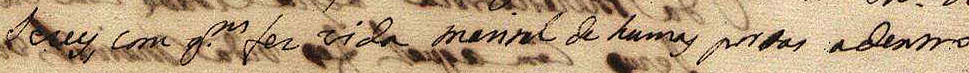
Iezus, com q.m fez vida marital de humas portas adentro
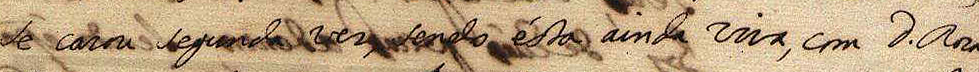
se cazou segunda vez, sendo ésta ainda viva, com D. Roza
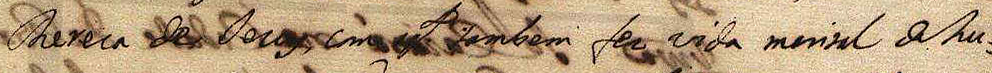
Thereza de Iezus, com a q.la tambem fez vida marital de hu
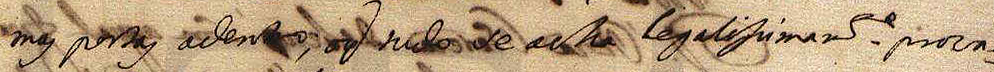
mas portas adentro, o q̄ tudo se acha legalissimam.te prova
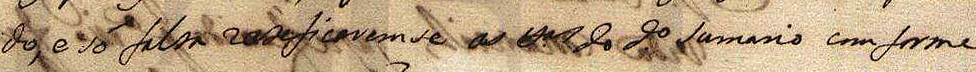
do, e só falta rateficaremse as tt.as do d.o sumario comforme
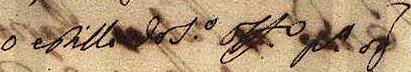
o estillo do S.o off.o p.a o q̄
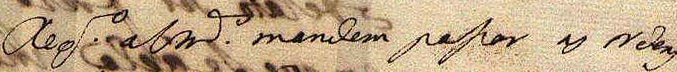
Ao p.o a V M.es mandem passar as ordens
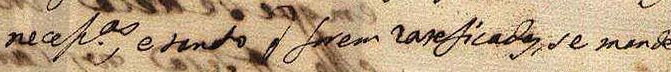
necesr.as, e tanto q̄ forem rateficadas, se mande
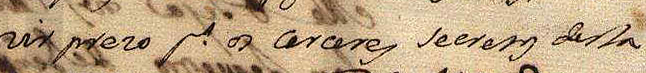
vir prezo p.a os carceres secretos desta
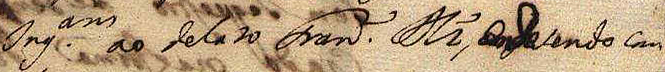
Inq.am ao delato Fran.co Alz̄, onde sendo com
